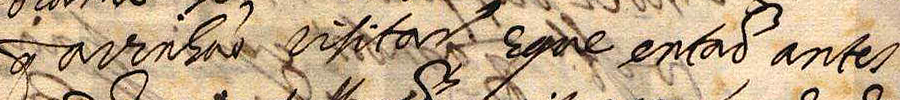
q̄ a vinhaõ visitar E que entaõ, antes
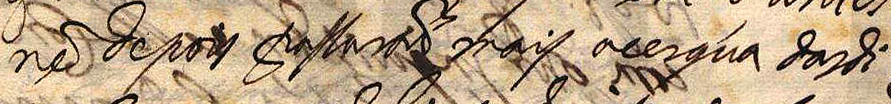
nē depois passaraõ mais acerqua das di
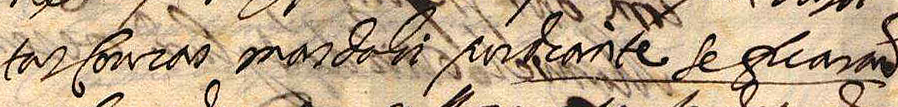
tas Couzas mas dahi por diante se ficaraõ
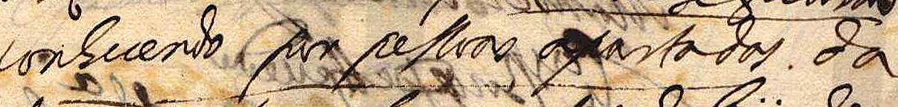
conhecendo por pessoas apartadas da
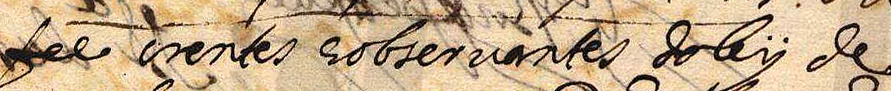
fee crentes E obseruantes da ley de
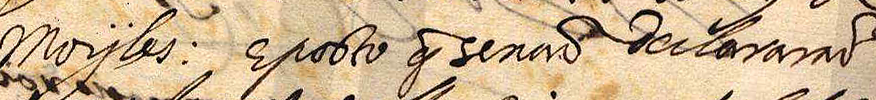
moyses: E posto q̄ se naõ declararaõ
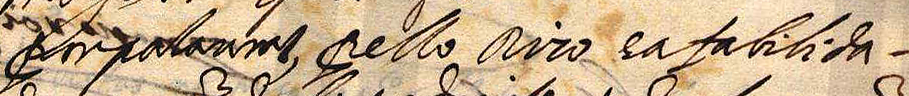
por palauras, pello Rizo e afabilida
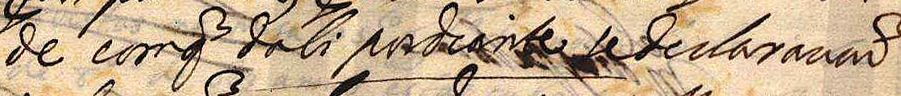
de com q̄ dali por diante se declarauaõ
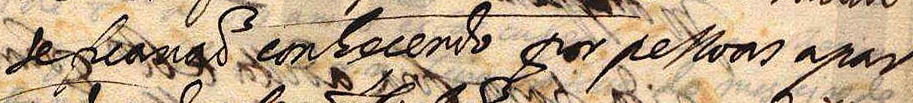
se ficauaõ conhecendo por pessoas apar
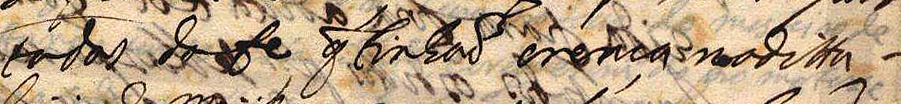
tadas da fe, q̄ tinhaõ crença na ditta
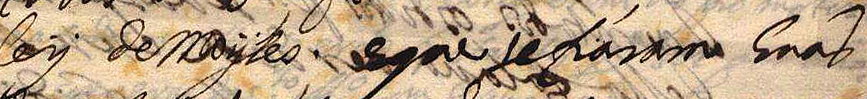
ley de Moyses; E que se fiaram huas̄
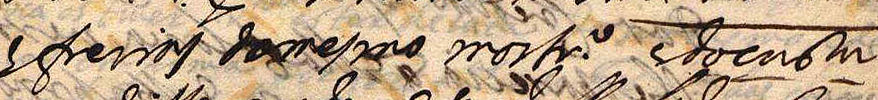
E freiras do mesmo mostr.o e do custu
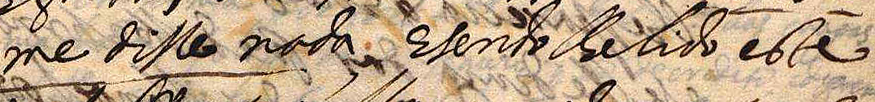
me disse nada. E sendo lhe lido este
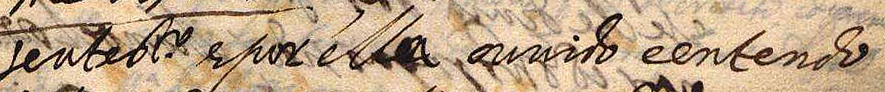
seu test.o E por ella ouuido e entendo
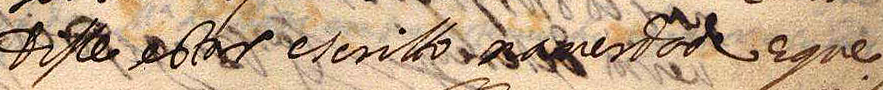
Disse estar escritto na uerdade E que
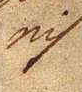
nis
